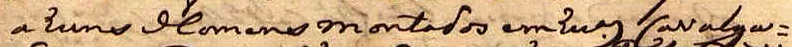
a huns Homens montados em huas Cavalga
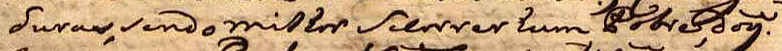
duras, sendo milhor secorrer hum Pobre do q̄
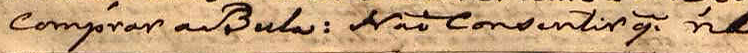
comprar a Bula: Naõ consentir q̄ na
